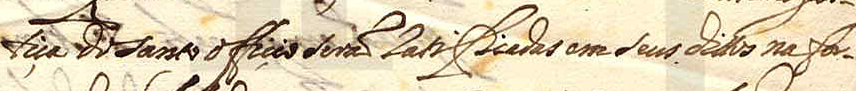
tiça do santo officio seraõ Ratificadas em seus ditos na for
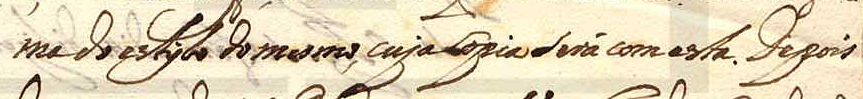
ma do estylo do mesmo, cuja Copia será com esta. Depois
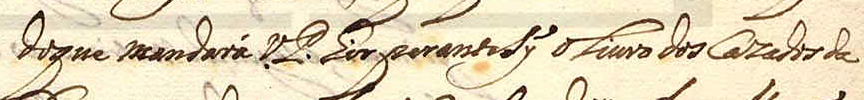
do que mandará V. P. hir perante sy o Liuro dos Cazados da
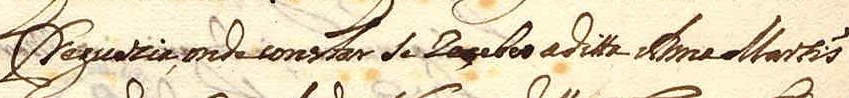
freguezia, onde constar se Recebeo a ditta Anna Martis̄
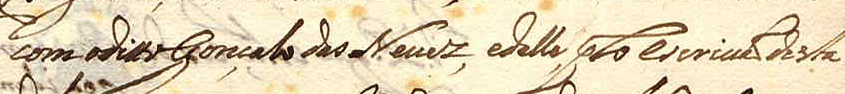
com o ditto Gonçalo das Neuez, e della plo escriuaõ desta
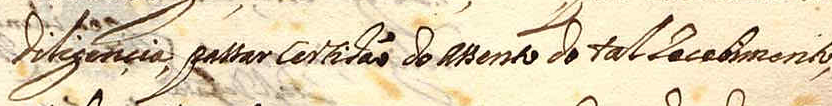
diligencia, passar certidaõ do assento do tal Recebimento,
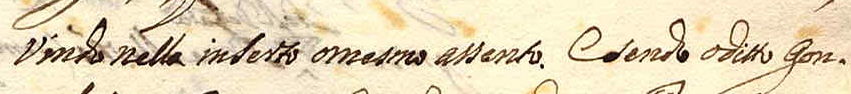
Vindo nella inserto o mesmo assento. E sendo o ditto Gon
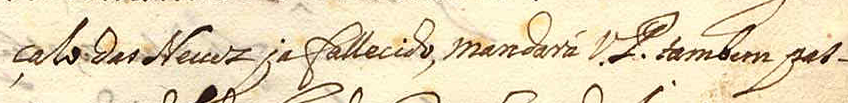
çalo das Neuez ja fallecido, mandará V. P. tambem pas
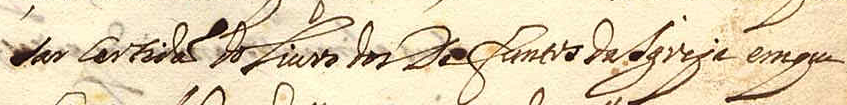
sar certidaõ do Liuro dos Defuntos da Igreja em que
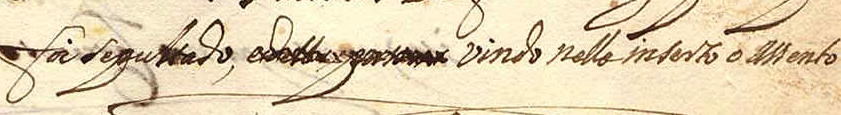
foi sepultado, e ditto por ser vindo nella inserto o assento
